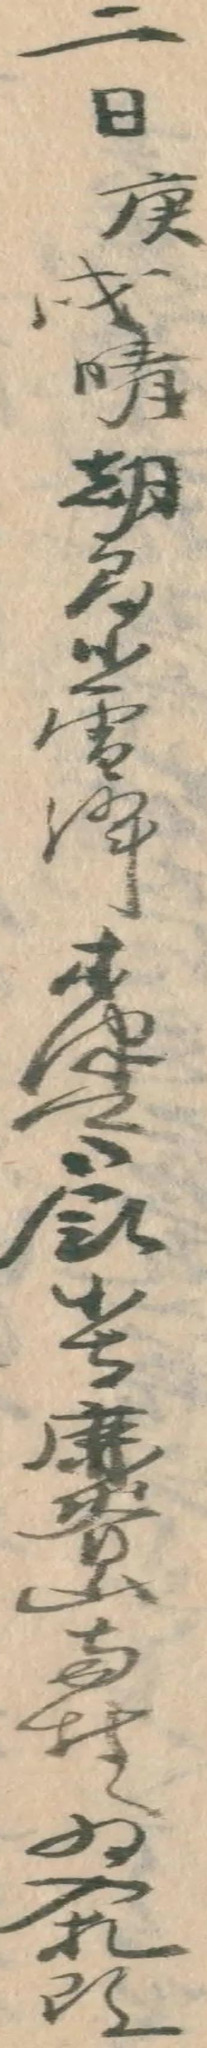二日庚戌晴朝間小雪降木津郷御領小寺鹿背山両村へ為入札改
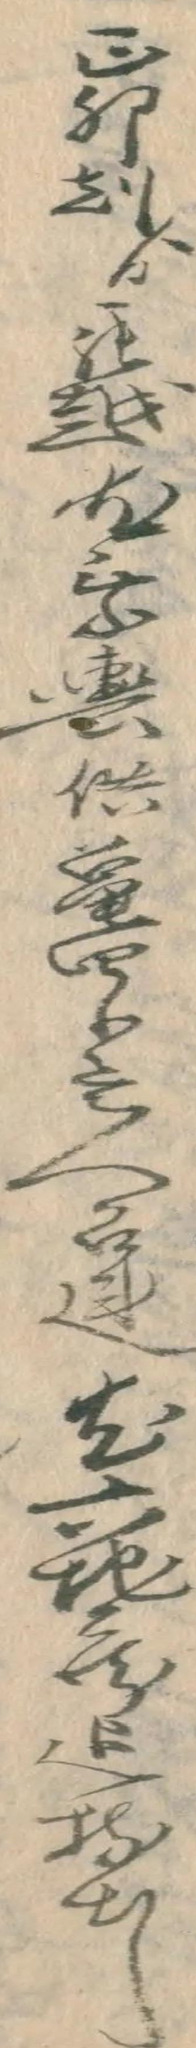正卯刻ゟ被越尤乗輿供亀四郎壱人召連尤六地蔵迄持出し
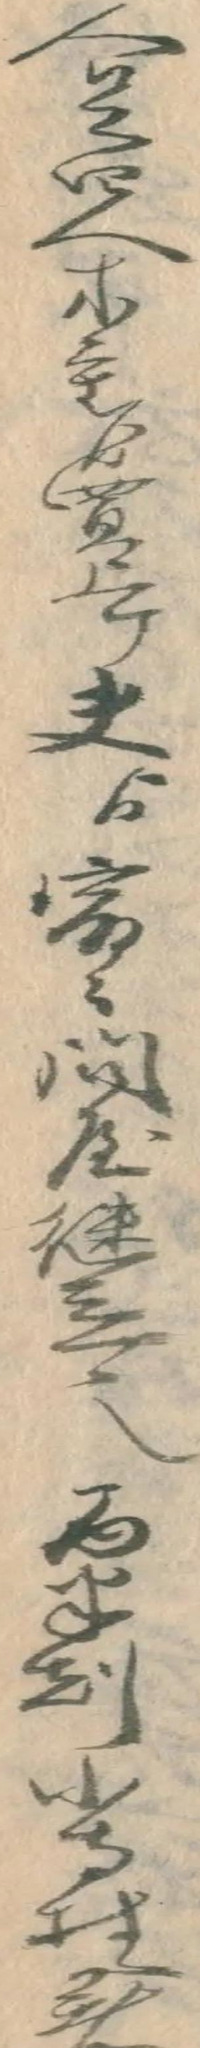人足四人木宅ゟ買上ケ夫ゟ宿々問屋継立之酉半刻小寺村へ着

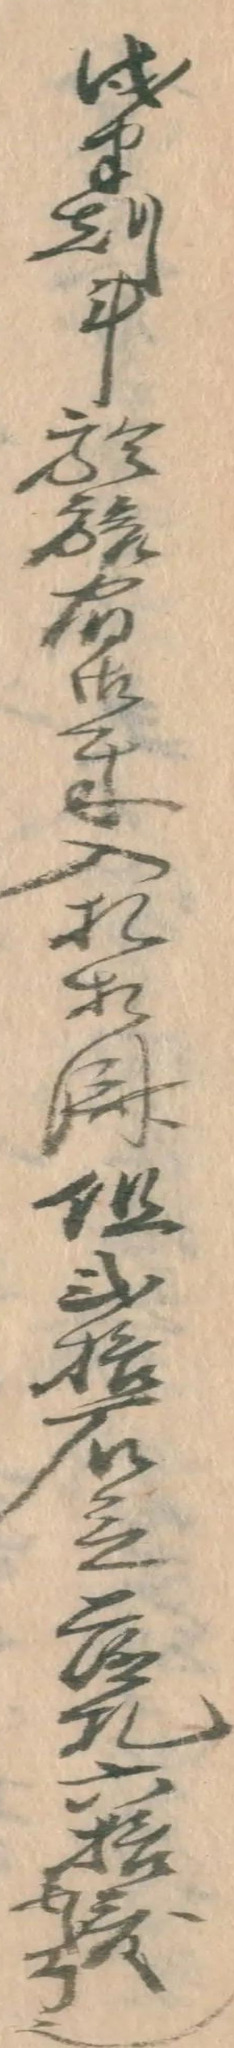戌半刻斗於旅宿御参入札相済但弐拾石立落札六拾三反も有之
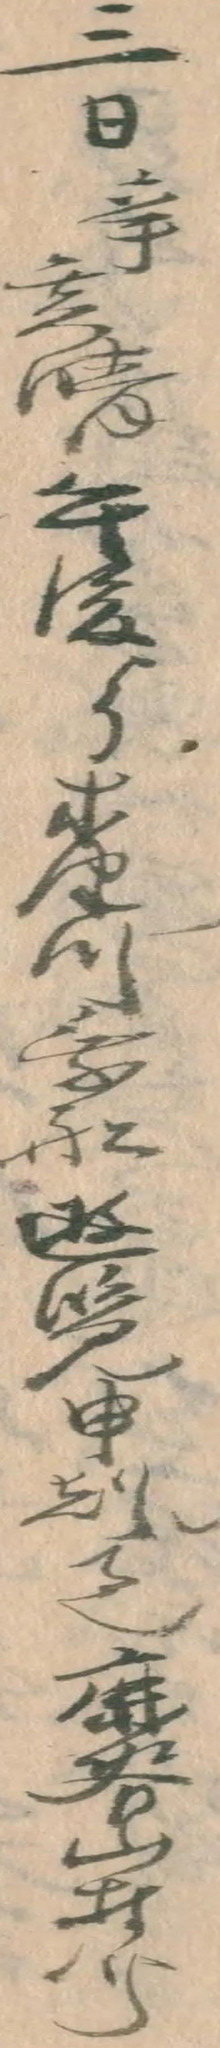三日辛亥晴午後より木津川乗船遊覧申刻過鹿背山村分
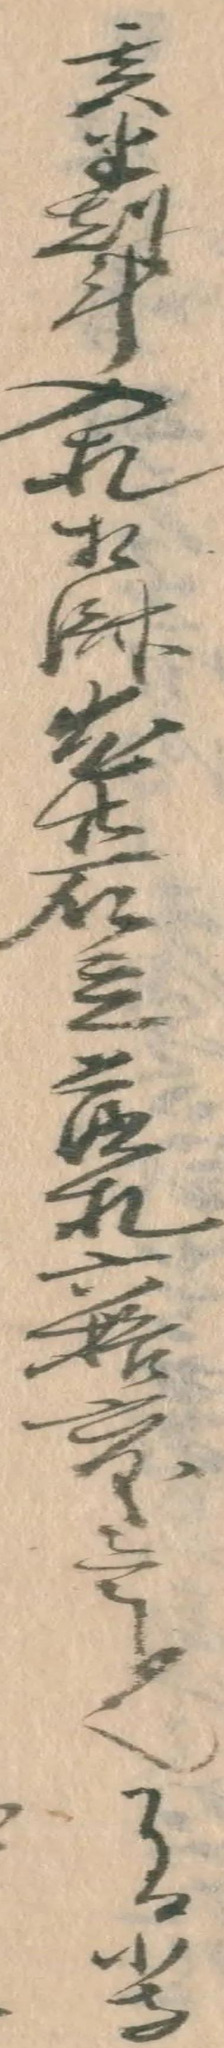亥半刻斗入札相済尤廿石立落札六拾六匁壱夕也了而小寺
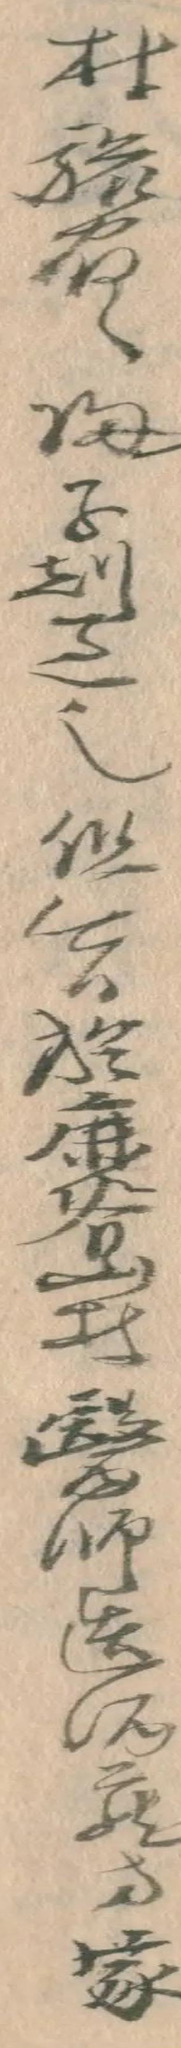村旅宿へ帰子刻過也但今日於鹿背山村醫師送酒蔵方家
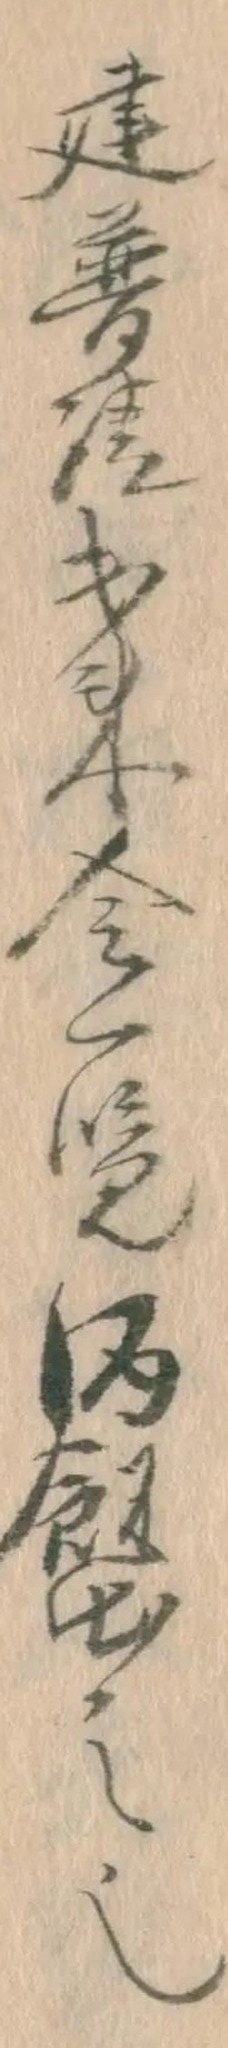建普請出来令一覧酒飯出之也
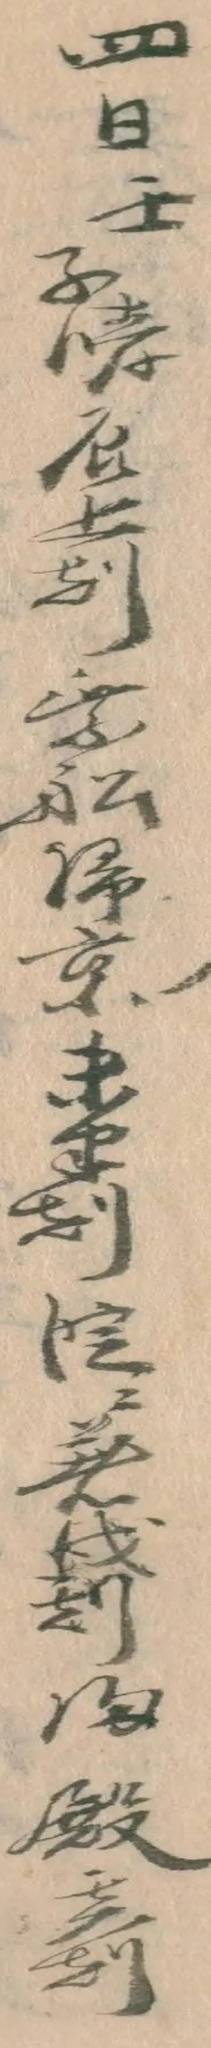四日壬子晴辰上刻乗舩帰京未半刻淀ニ着戌刻帰殿亥刻
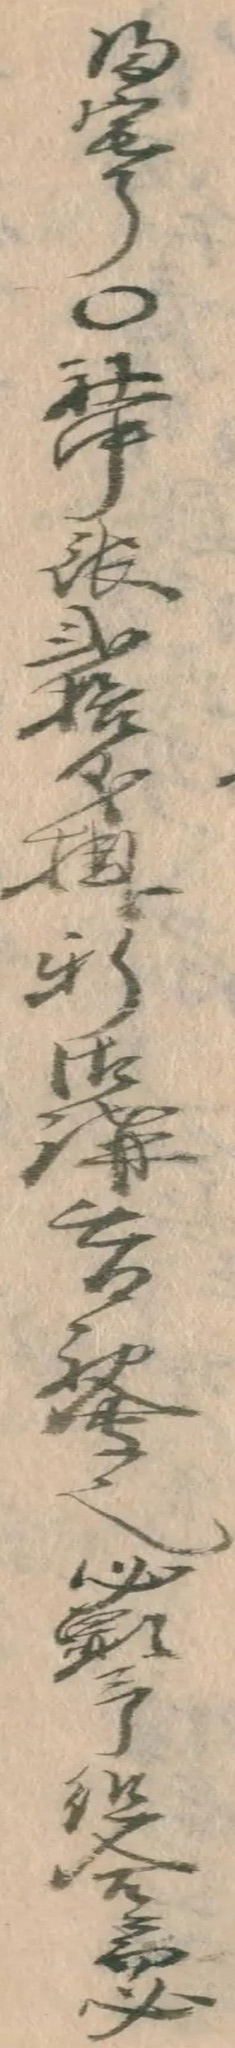帰宅了○社中銀弐拾匁掛新御講今日初會也必顕予組合ニ而必
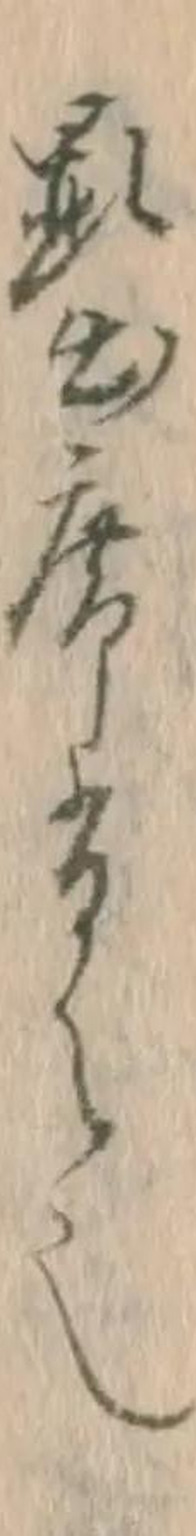顕出席有之也
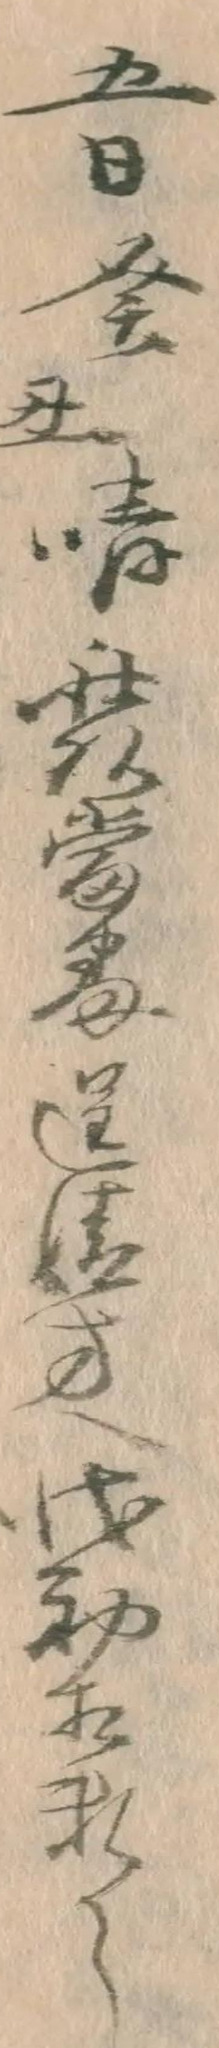五日癸丑晴社頭當番逞清方へ代勤相頼了
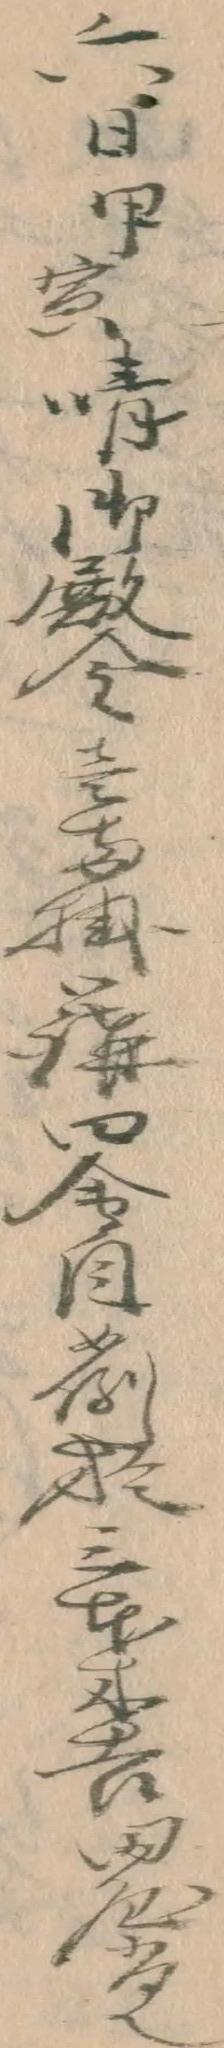六日甲寅晴御殿金壱両掛御講四會目如例於三本木吉田屋有之
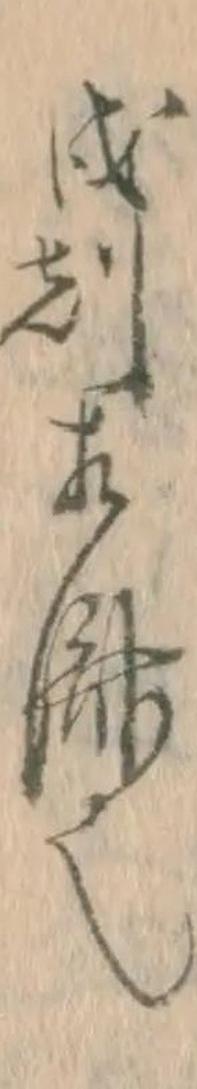戌刻相済也
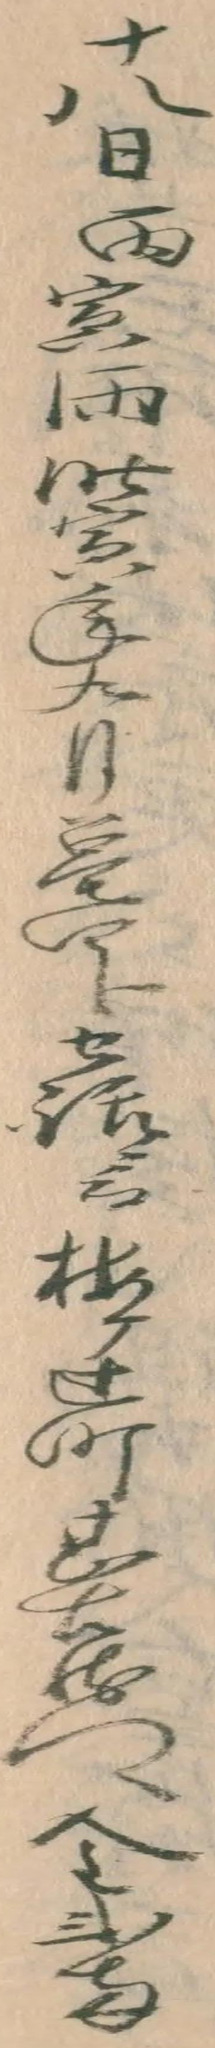十八日丙寅雨昨寅年九月亀四郎世話ニ而梅ケ辻町甚右衛門へ金弐両
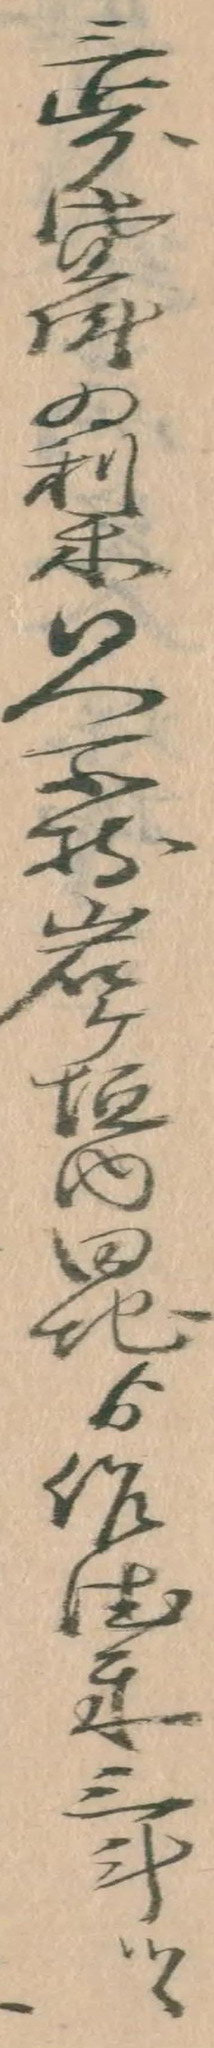三歩貸附為利米同人所持岩ケ垣内田地ゟ作徳米三斗ツヽ
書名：賀茂社記録. 第66冊
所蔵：国立国会図書館 National Diet Library, JAPAN
